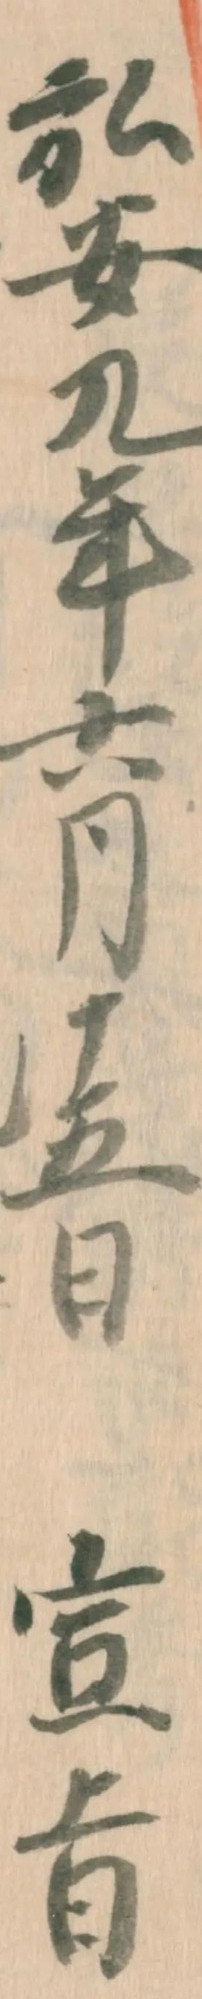弘安九年六月十五日宣旨
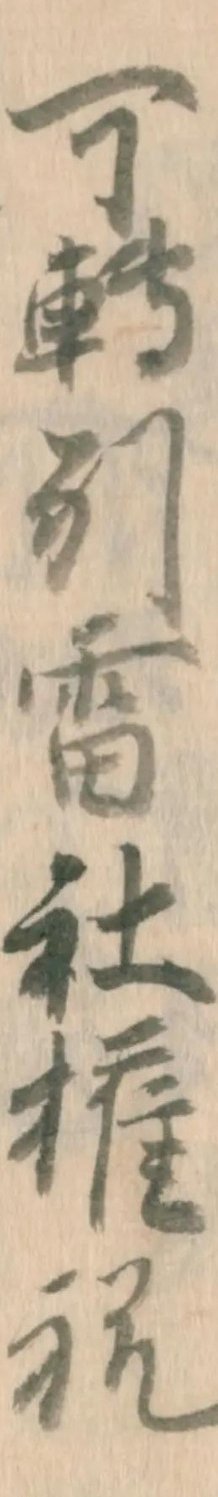可転別雷社権祝
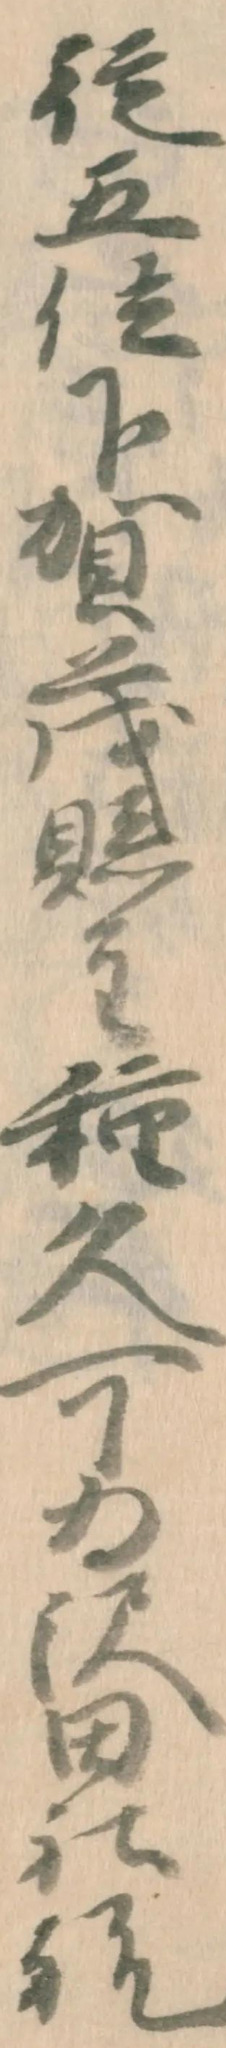従五位下賀茂県主種久可為沢田社祝
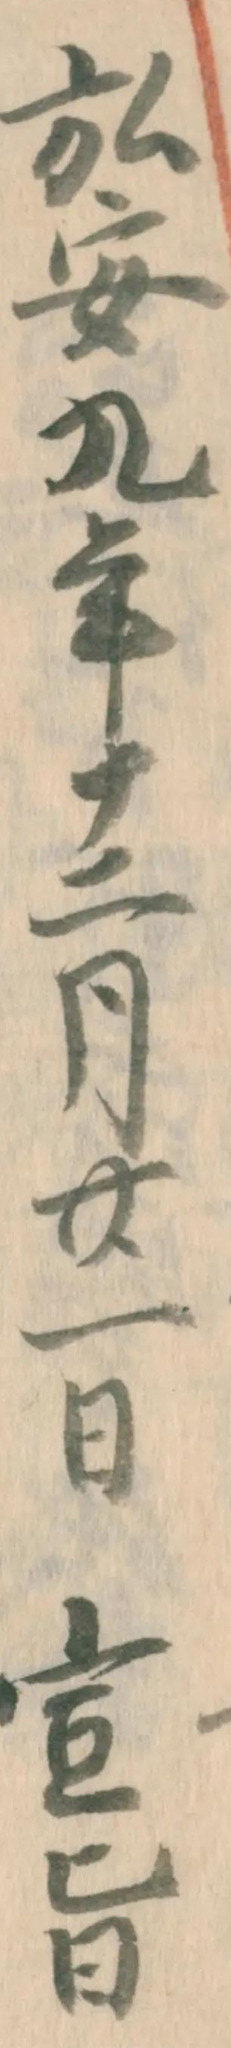弘安九年十二月廿一日宣旨
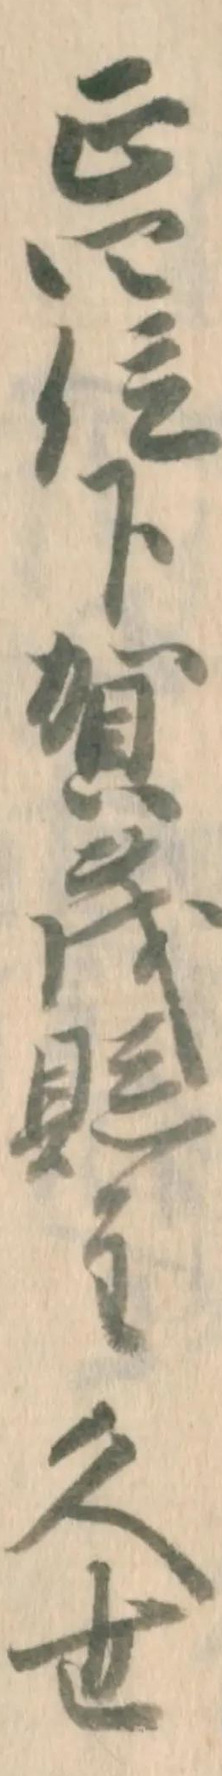正四位下賀茂県主久世
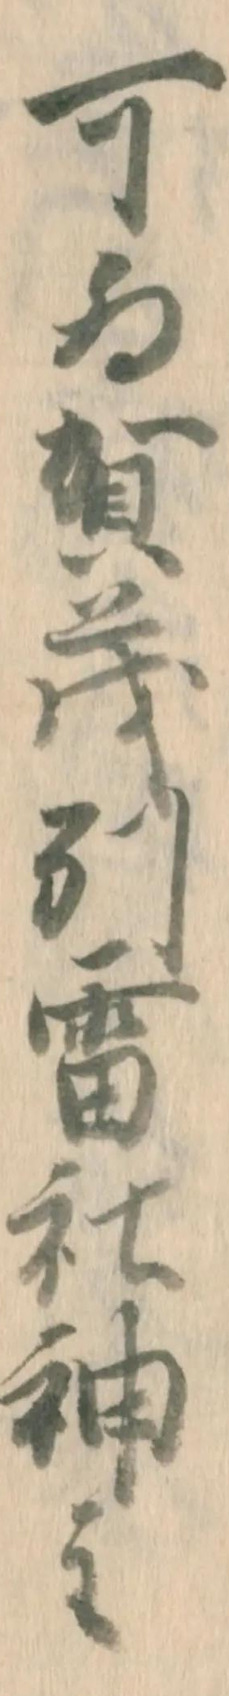可為賀茂別雷社神主
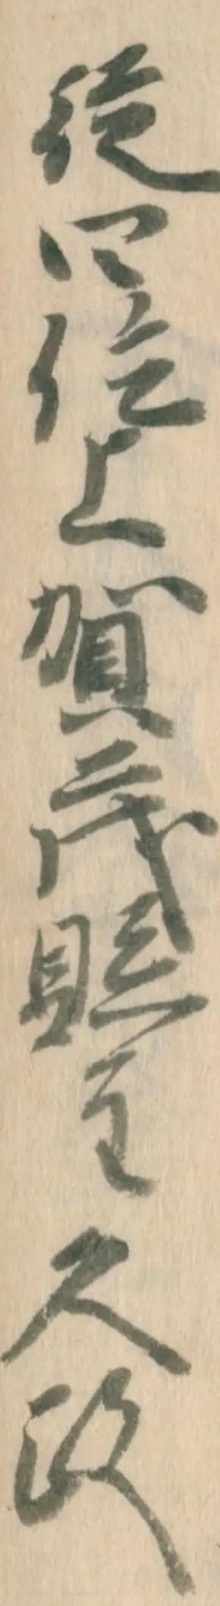従四位上賀茂県主久政

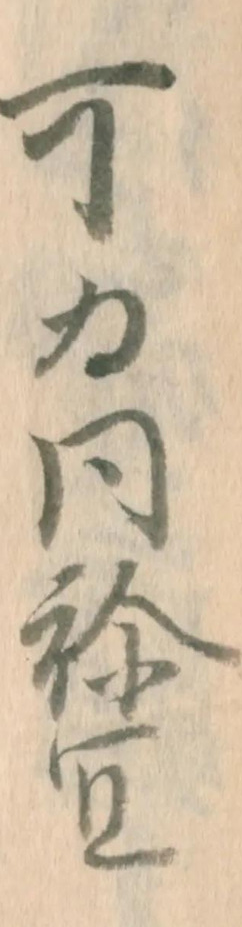可為同祢宜
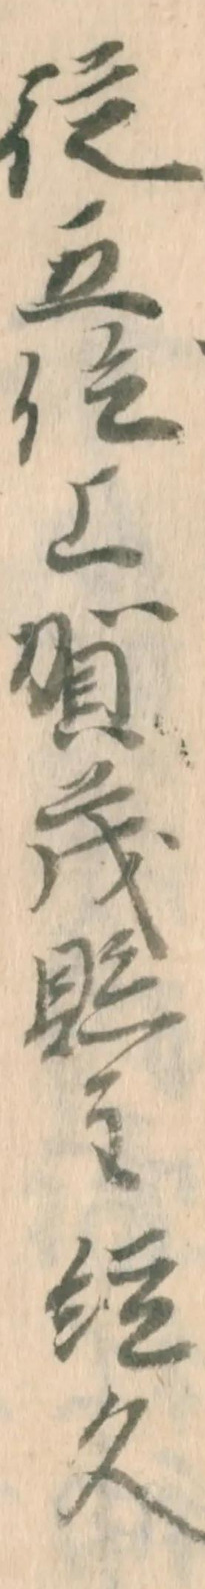従五位上賀茂県主経久
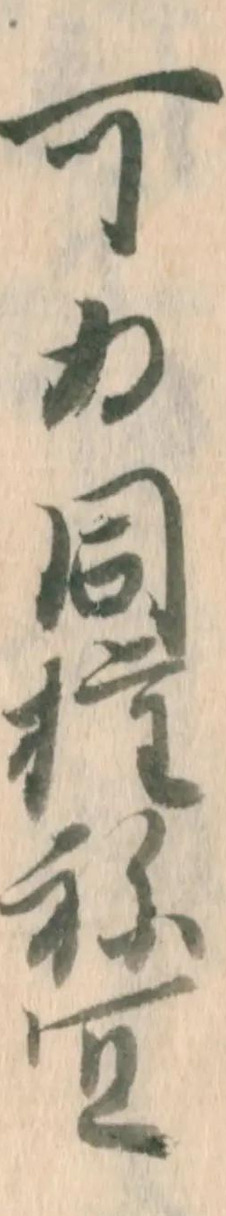可為同権祢宜
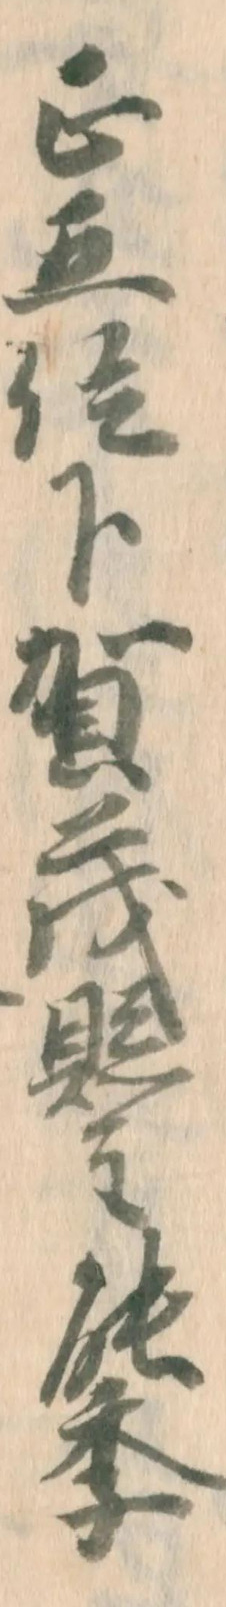正五位下賀茂県主能季
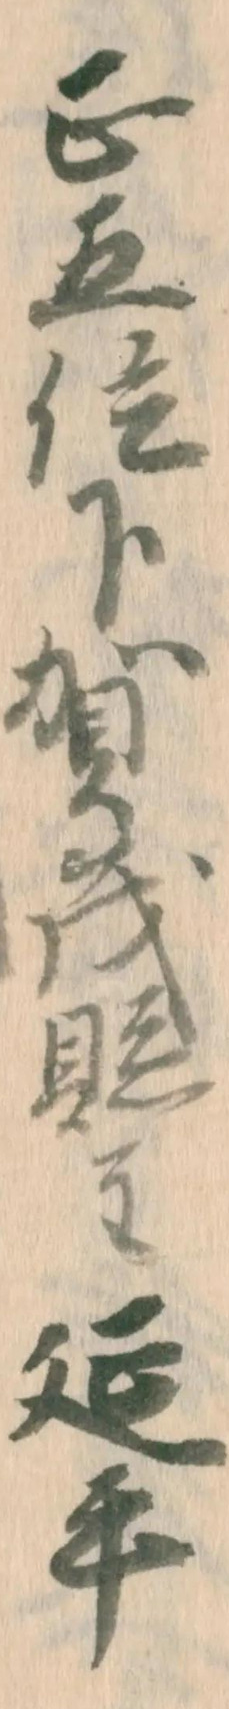正五位下賀茂県主延平
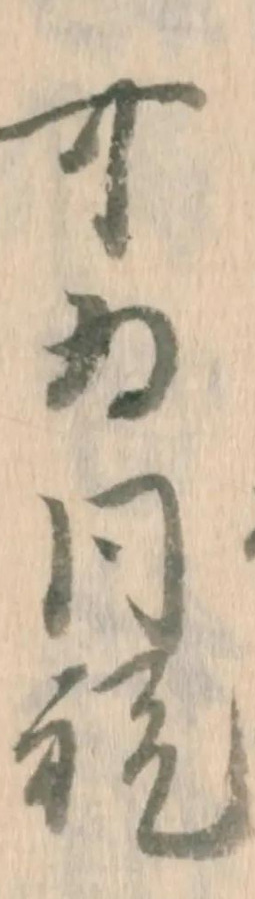可為同祝
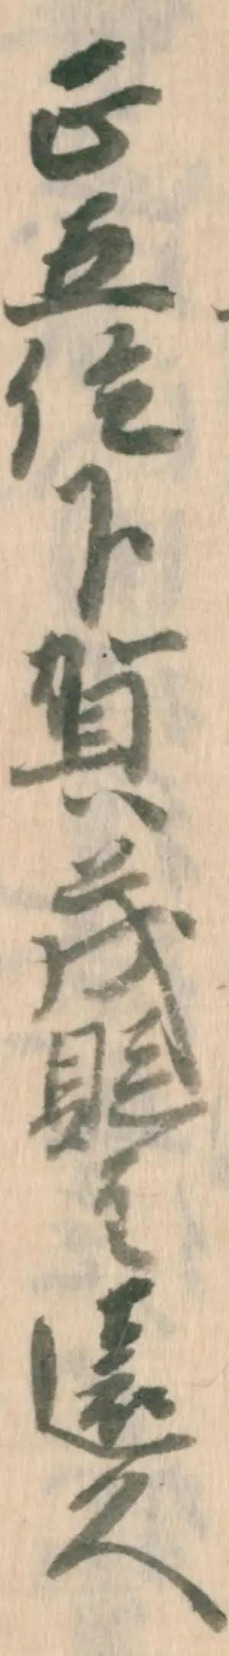正五位下賀茂県主遠久
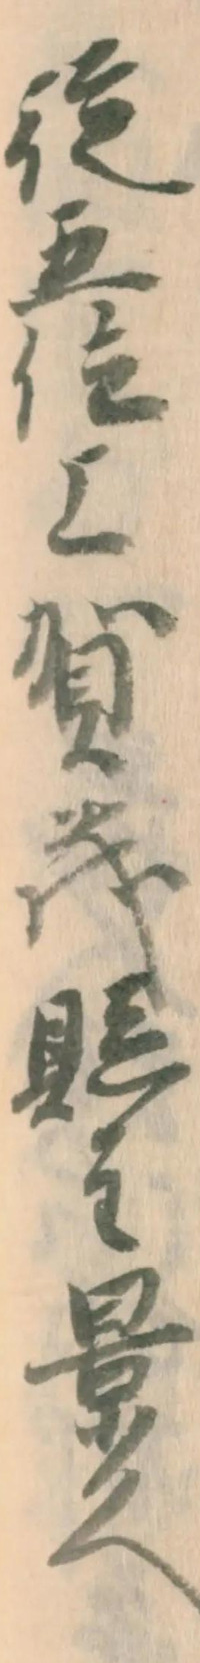従五位上賀茂県主景久
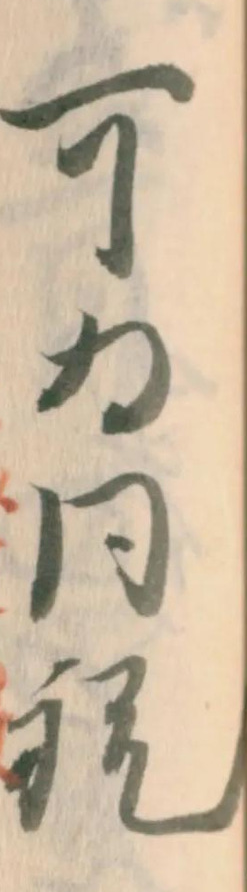可為同祝
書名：賀茂社記録. 第1冊
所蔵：国立国会図書館 National Diet Library, JAPAN
